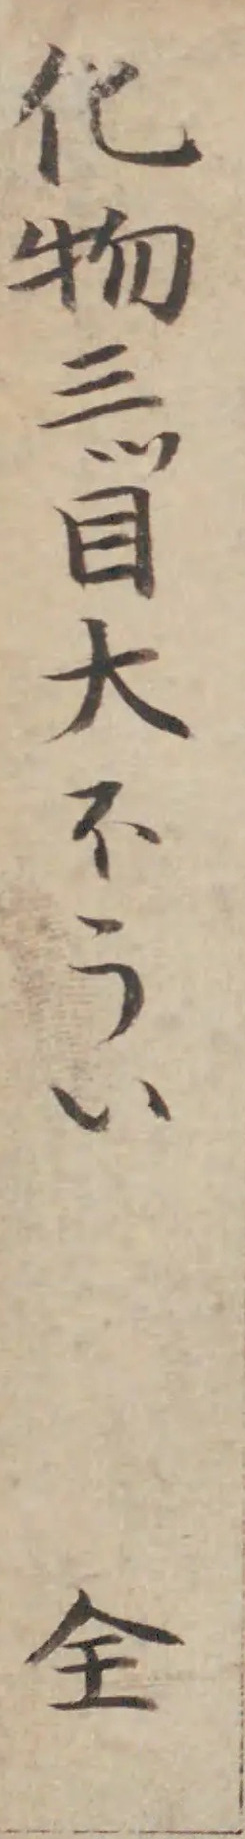化物三つ目大ほうい全
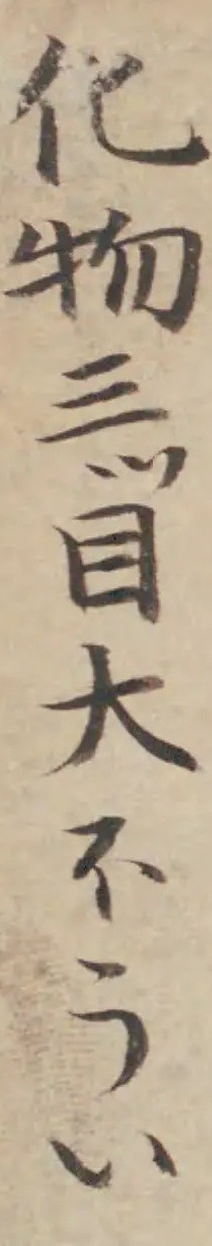化物三つ目大ほうい全

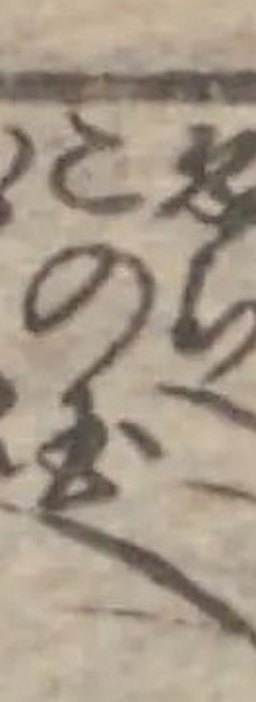この国
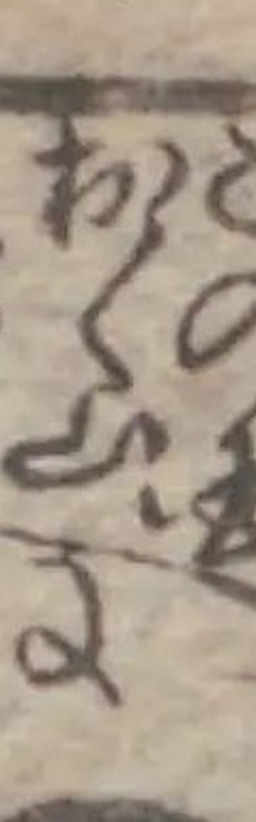おく山に
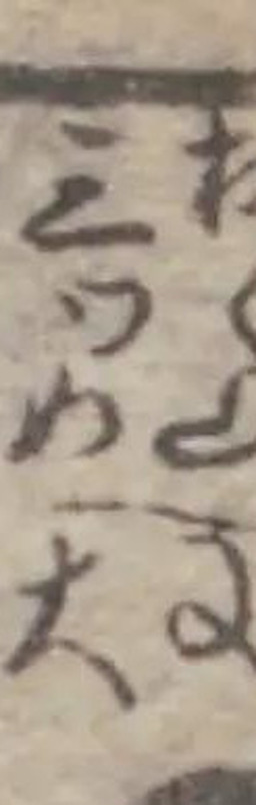三つめ大
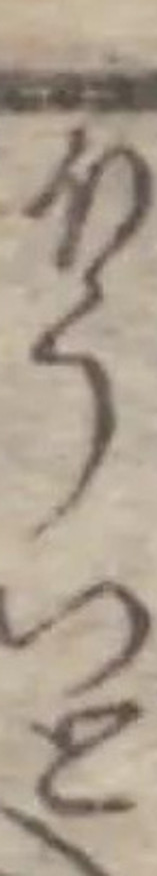ほうつと
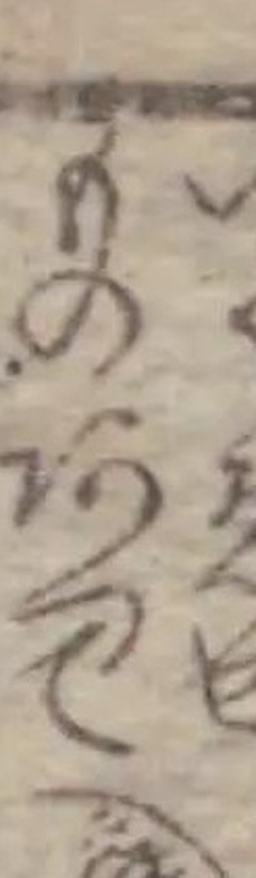ものあつて
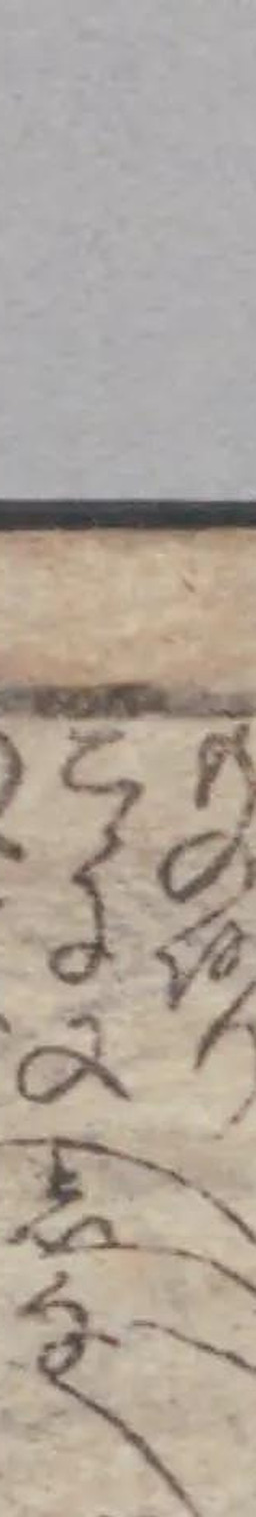こゝに又しな
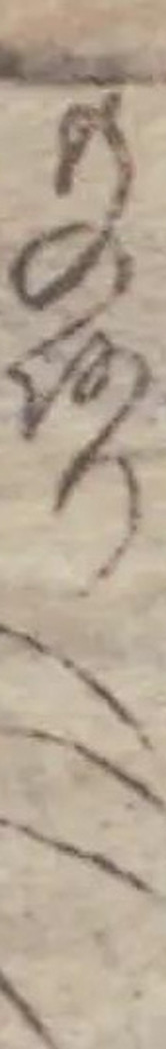ものあり
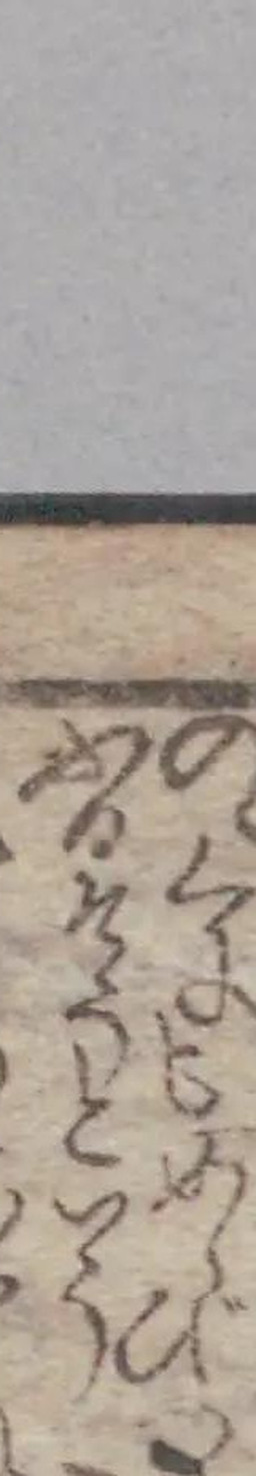ふるそうという
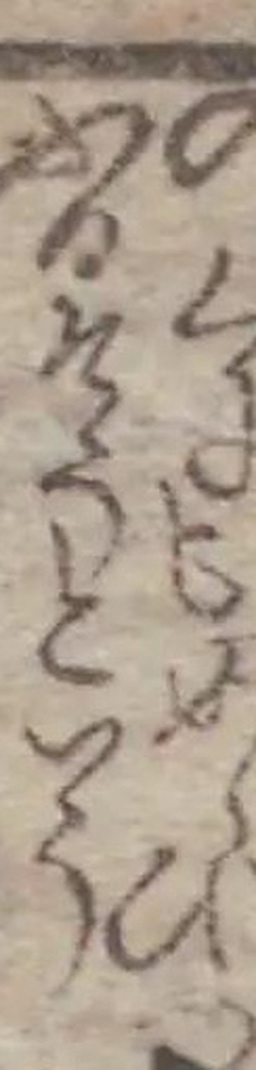ふるそうという
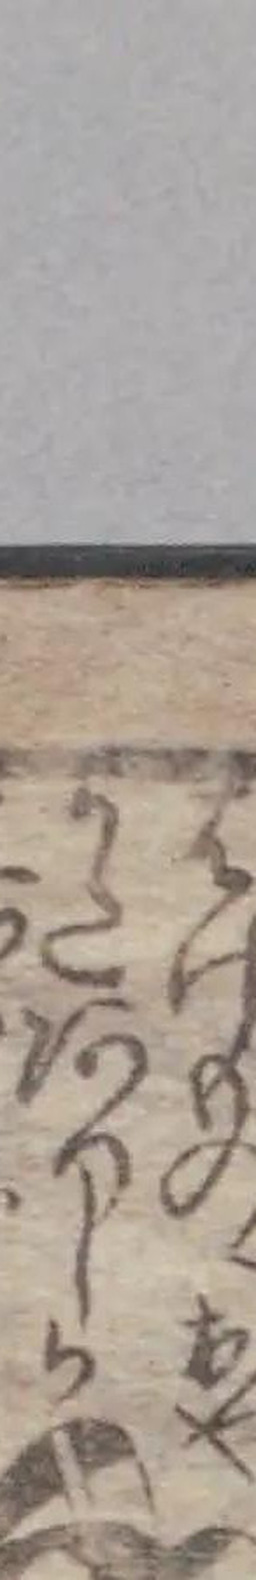かたありしか
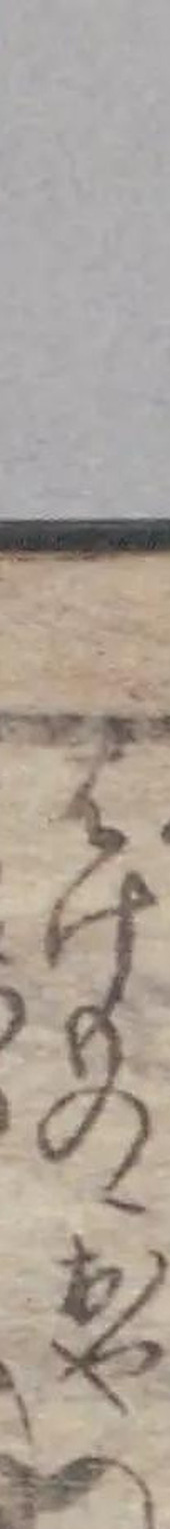はけものゝおや
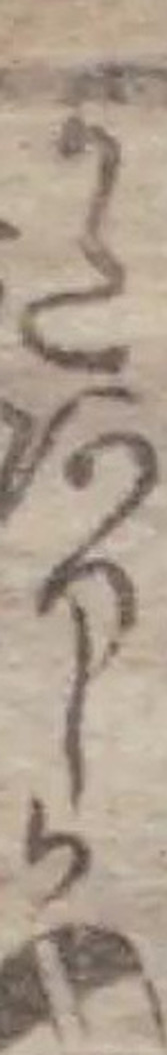かたありしか
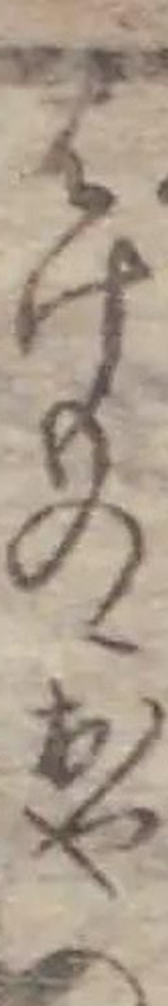はけものゝおや
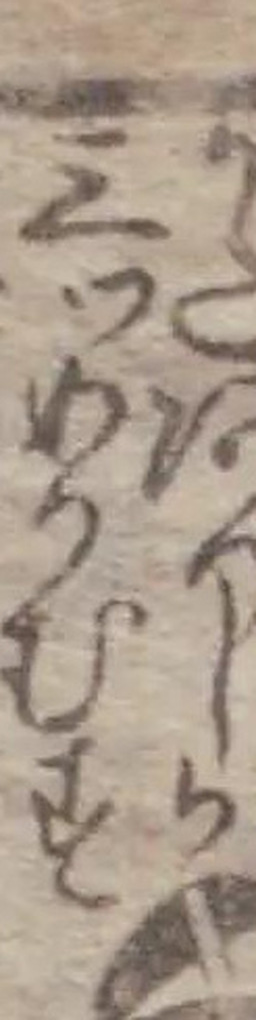三つめかむす
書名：化物三ツ目大ほうい 2巻
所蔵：国立国会図書館 National Diet Library, JAPAN
